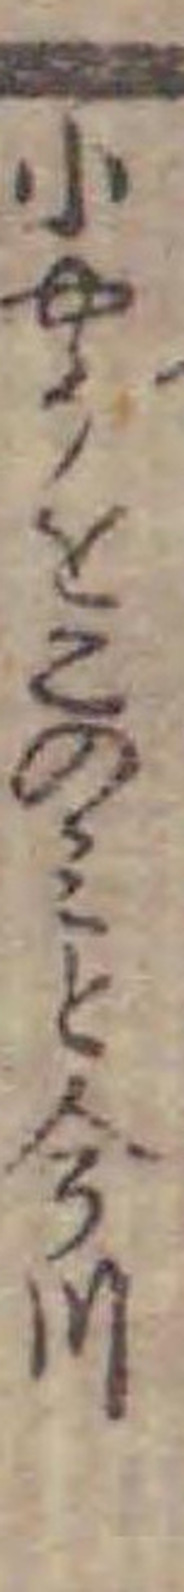小やうをこのみと今川
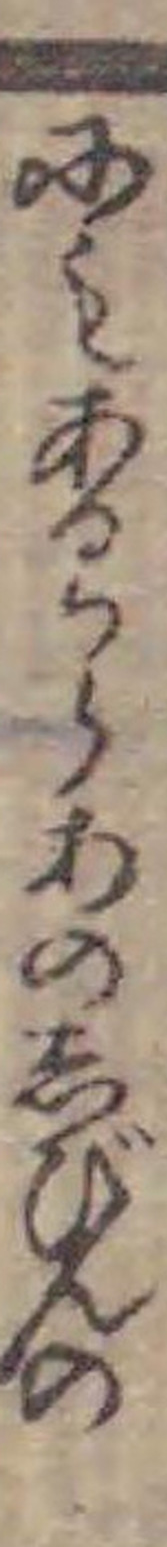にもあるからあのしびんの
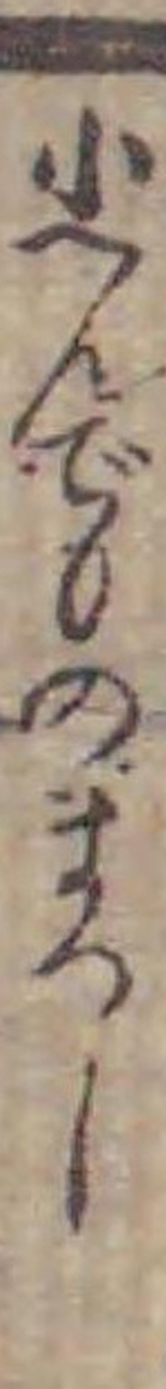小へんでものまつし
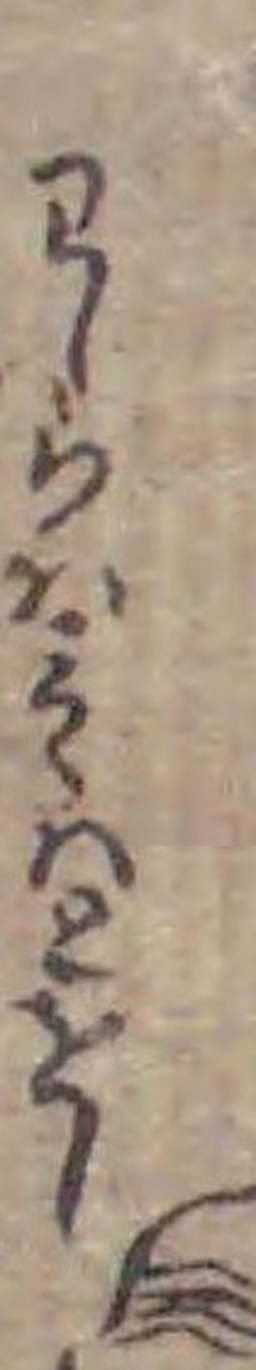わしらはみゝはとをし
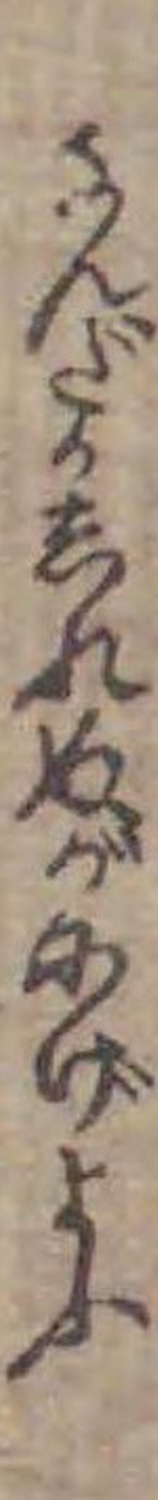なんだかしれぬがにげよふ
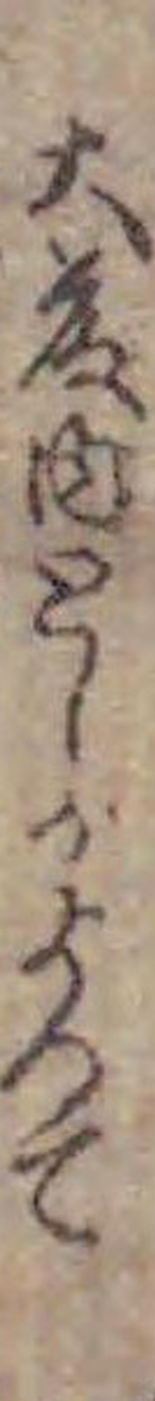大藤内としかよつて
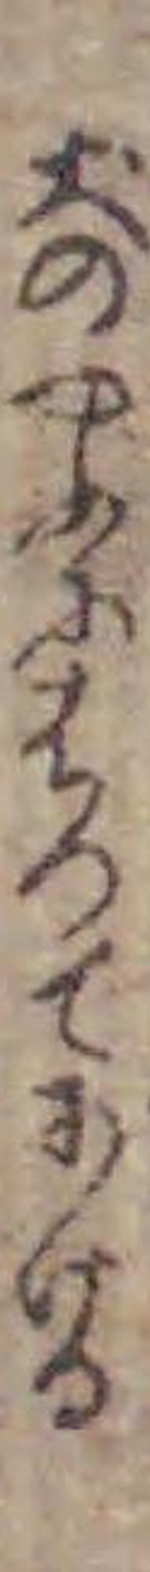犬のやふにはつてにける
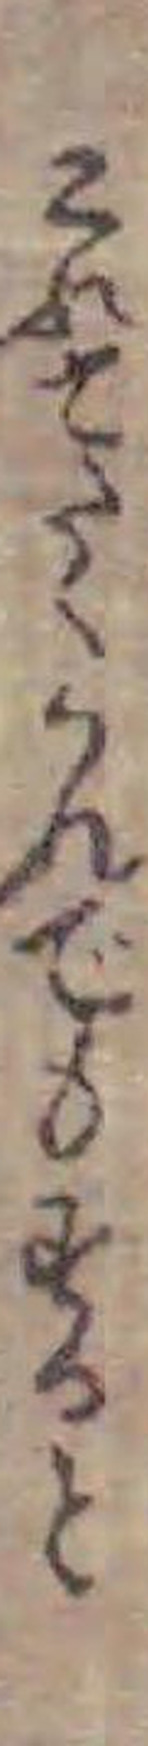これてたくかんでもすると
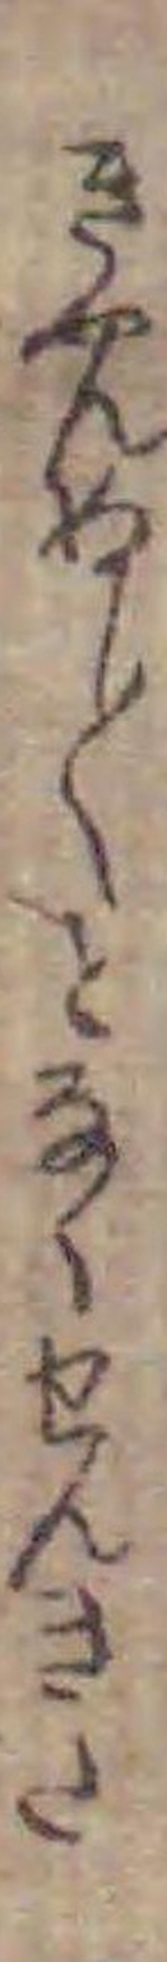きやんぬし〳〵となくせんきた

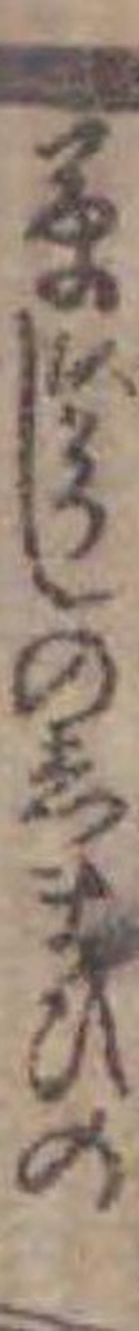草ぞうしのしまひの
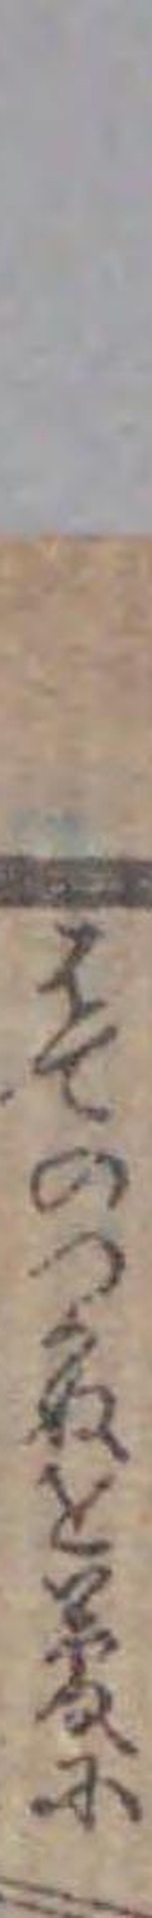はてのつかぬを夢に
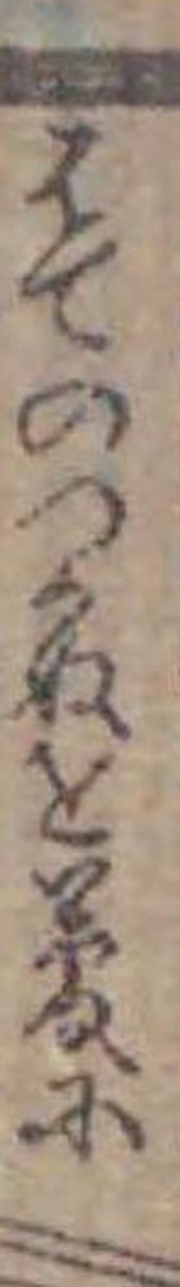はてのつかぬを夢に
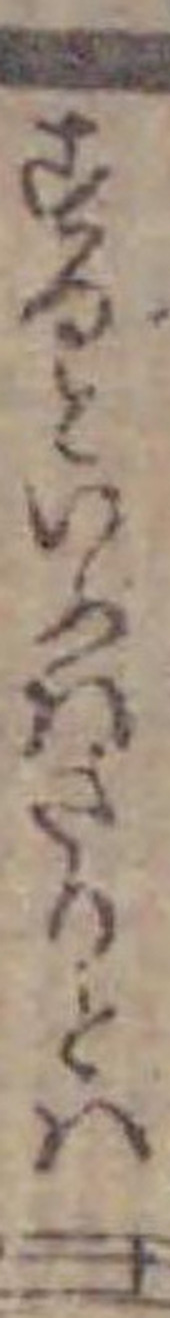するといふはさりとは
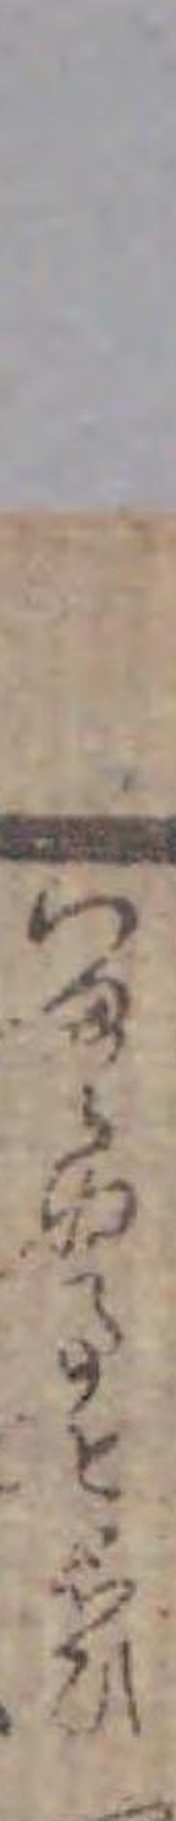つまらぬ事と思ひ
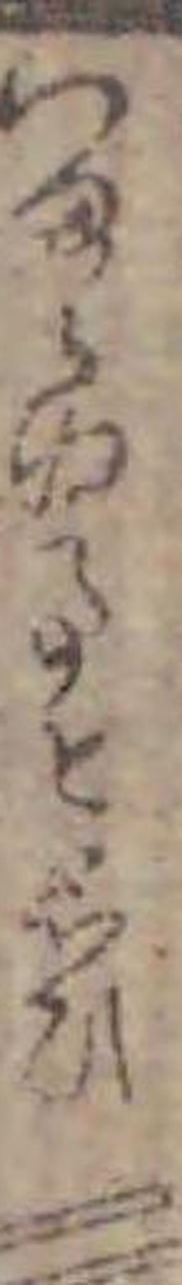つまらぬ事と思ひ
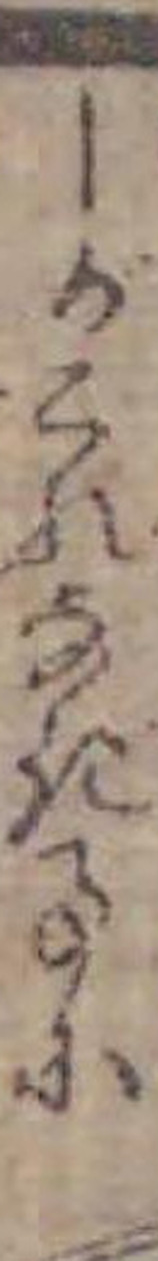しがこれなき事に
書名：年寄之冷水曽我 : 3巻
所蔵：国立国会図書館 National Diet Library, JAPAN
